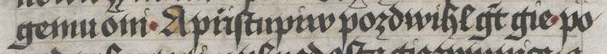gemu o ni.A pṙiſtupiv pozdwihl ḡt gie.po¬
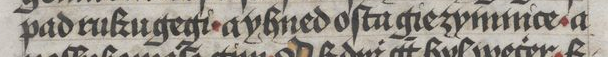pad ruku gegi.a yhned oſta gie zymnice.a
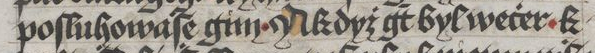poſluhowaẛe gim.A kdyż ḡt byl weċer.k¬
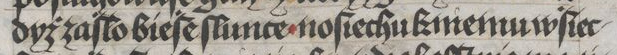dyž zaẛlo bíeẛe ſlunce.noſiechu knemú wẛiec¬
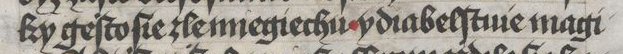ky geẛto ſie zle miegíechu.y diabelſtuíe magí¬
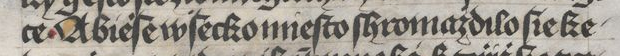ce.A bíeẛe wẛecko mieſto ſhromażdilo ſie ke¬
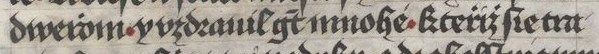dweṙom y vzdrauil ḡt mnohé.kteṙíż ſie tra¬
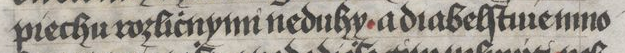píechu rozliċnými neduhy.a diabelſtuíe mno¬
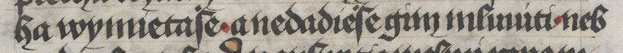ha wymetaẛe.a nedadíeẛe gim mluviti neb
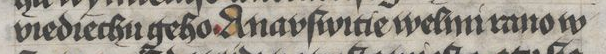medíechu geho.A na vſwitie velmi rano w¬
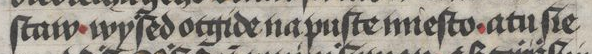ſtaro.wyẛed otgíde na puſte mieſto.atu ſie
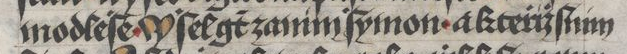modléẛe.Y ẛel ḡt zanim ẛymon a kteṙiż ſním
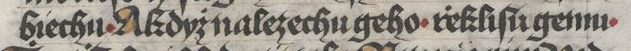bíechu.A kdyż nalezechu geho.ṙekliſu gemu.
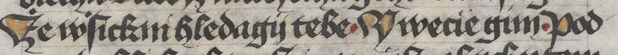Że wẛickni hledagij tebe.Y wecie gím.Pod¬
